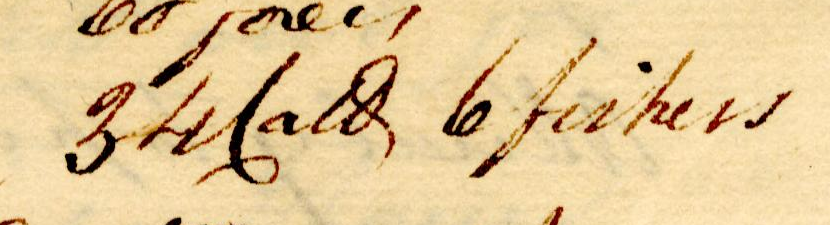34 Cald 6 feikers
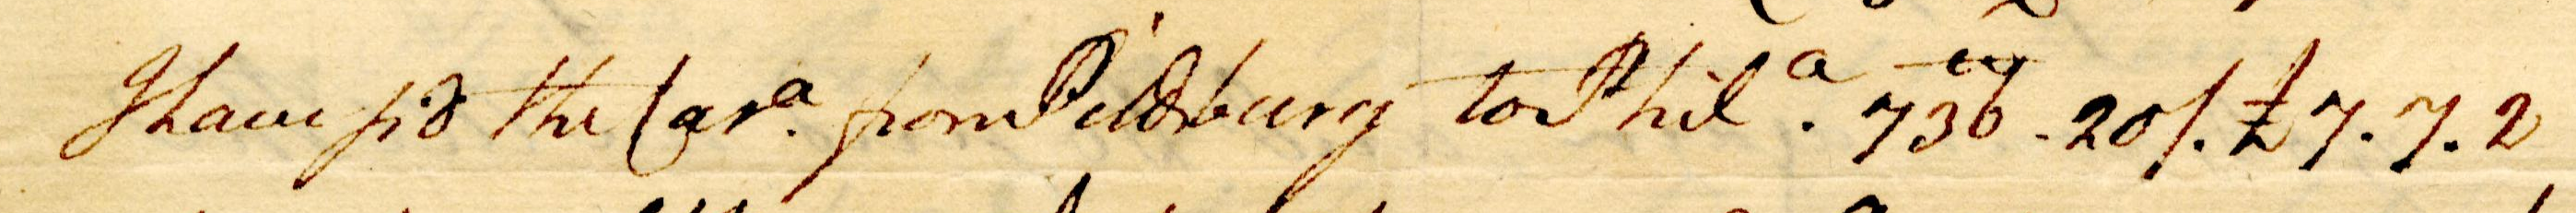I have p^d the Car^a. from Pitdsburg to Phil^a 736.20s. £7.7.2
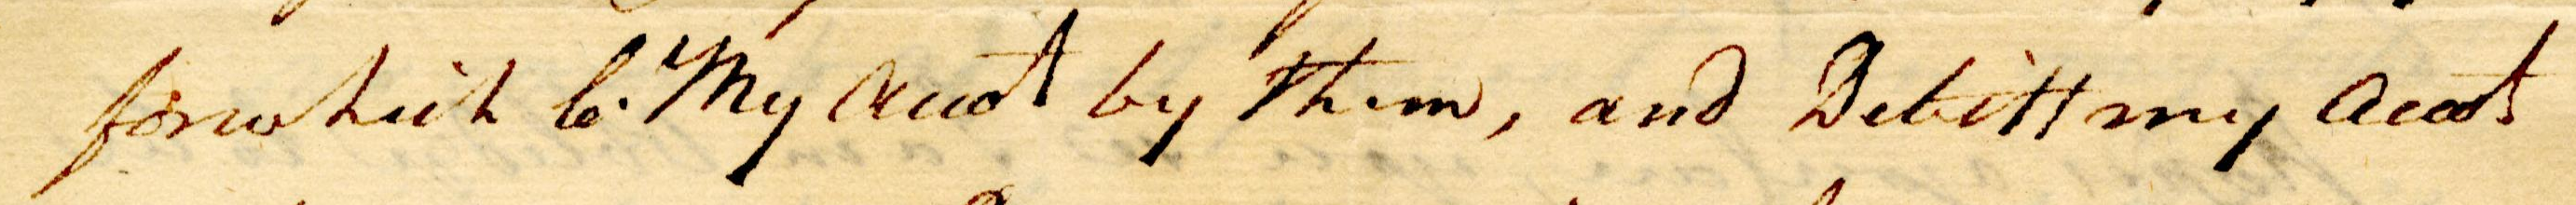for which 6. My acco^t by them, and Debitt my Acco^t.
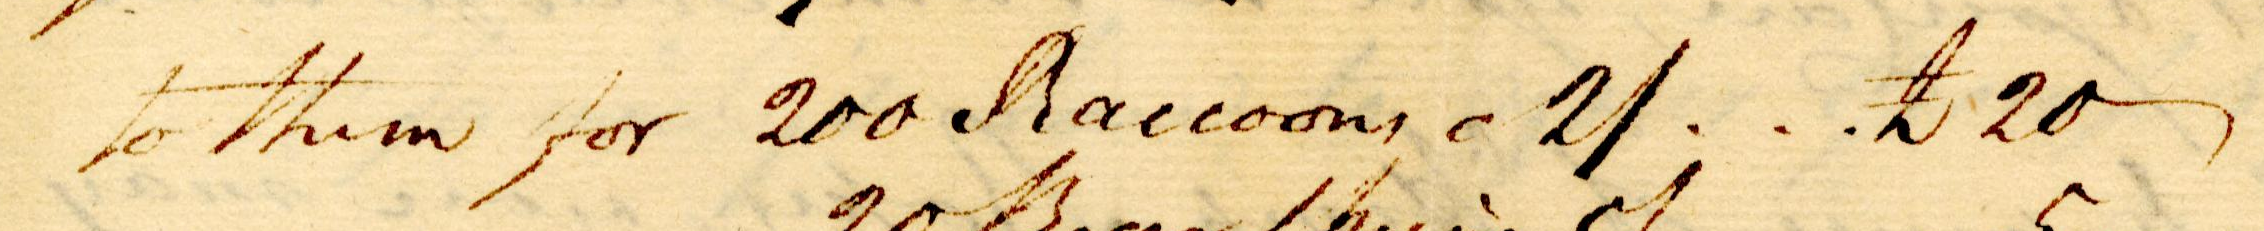to them for 200 Racoons a 2s... £20
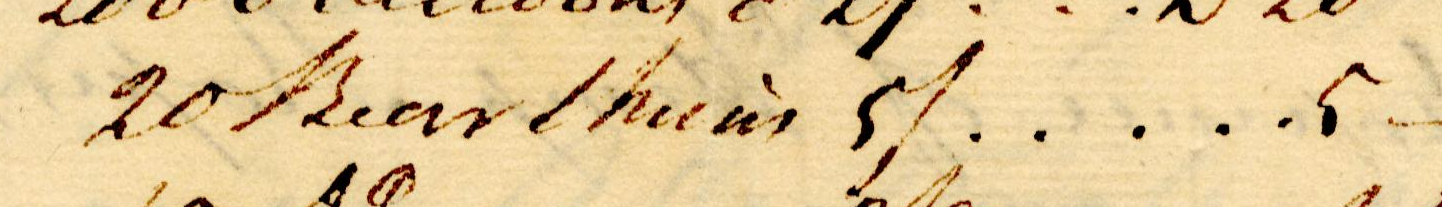20 Bear Skins 5s . . . . . 5
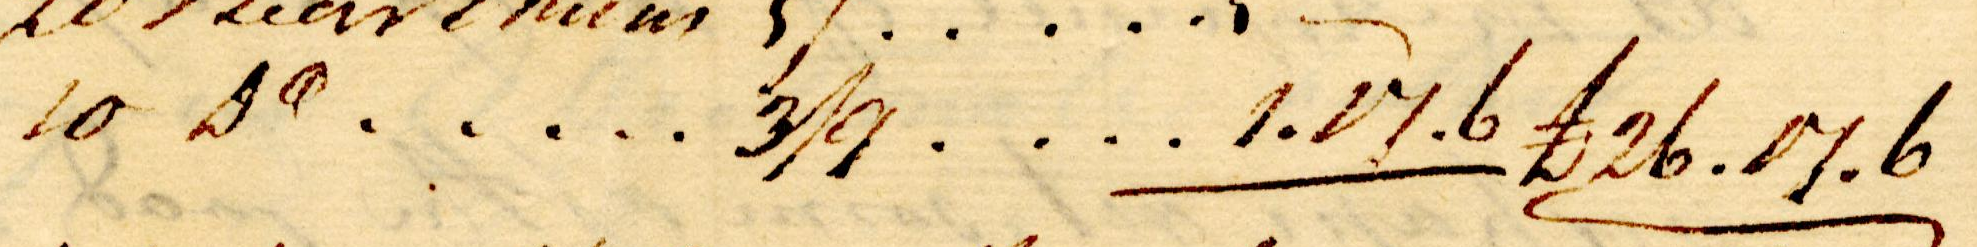10 D^o . . . . . 3s9 . . . . 1.17.6 £26.17.6
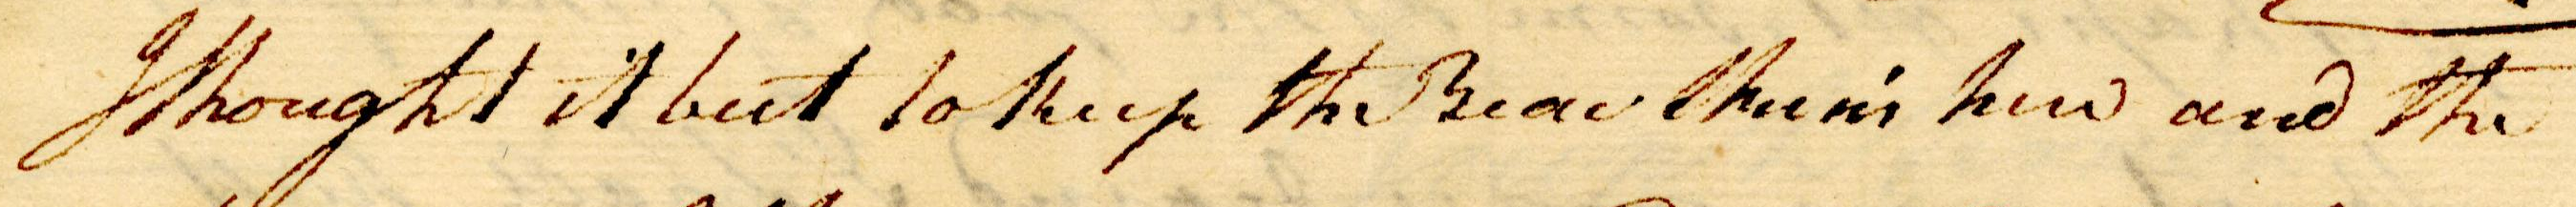I thought it but to keep the Bear skins here and the
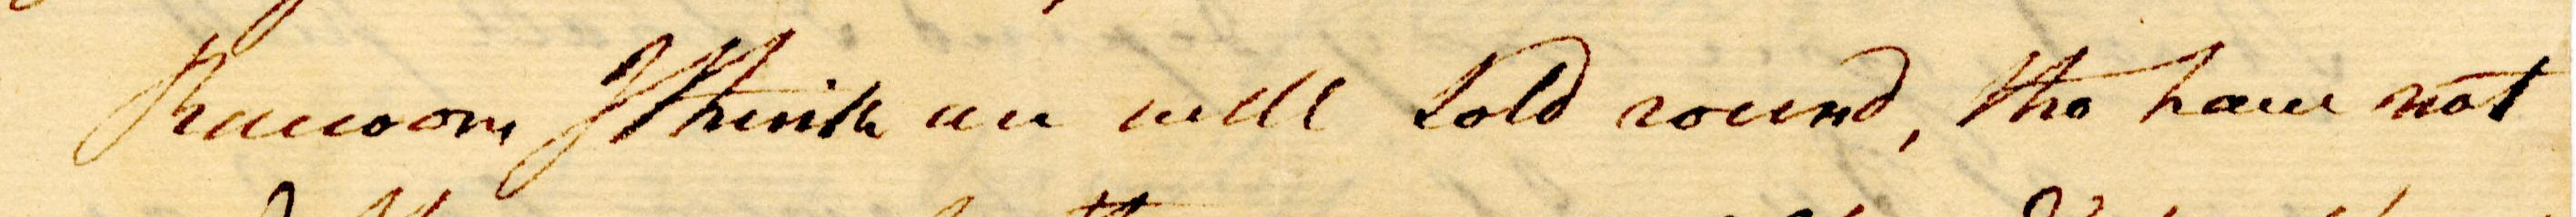Raccoon I think are well Sold round, tho have not
